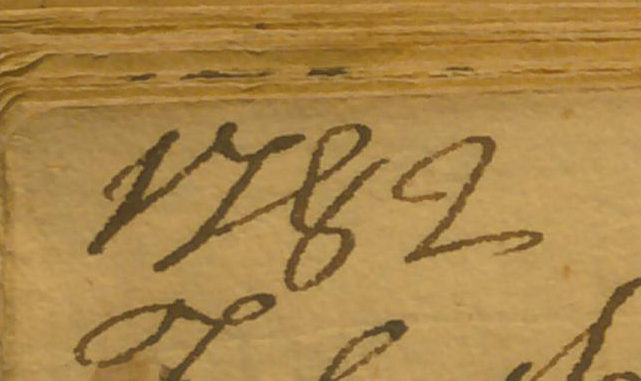1782
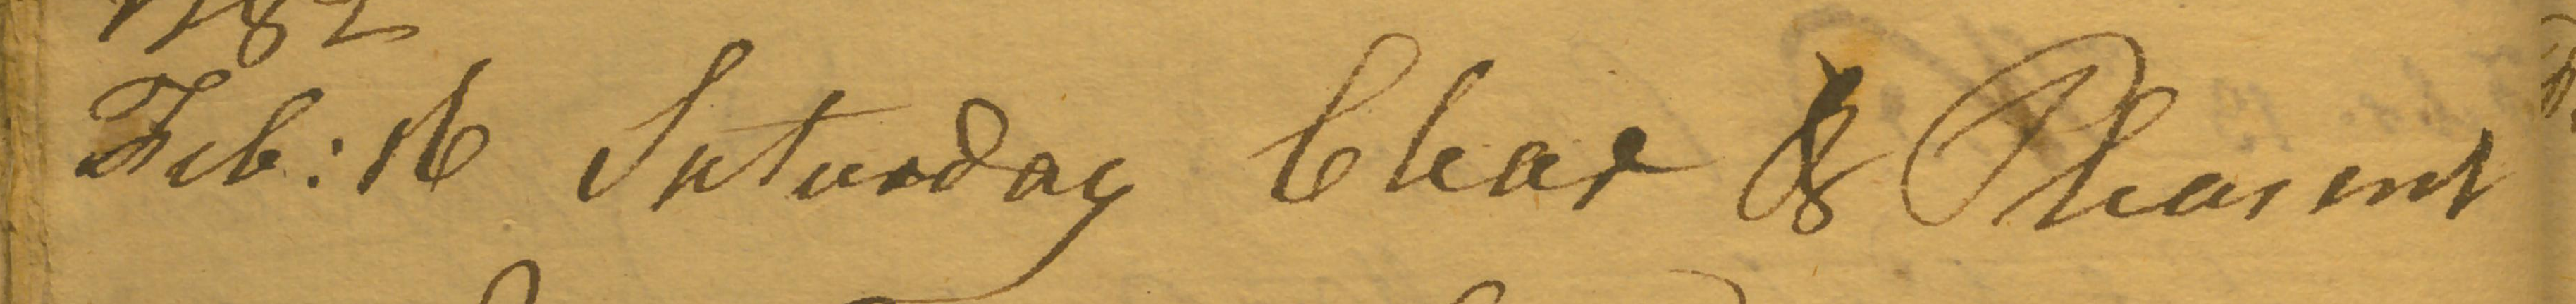Feb: 16 Saturday Clear & Pleasent
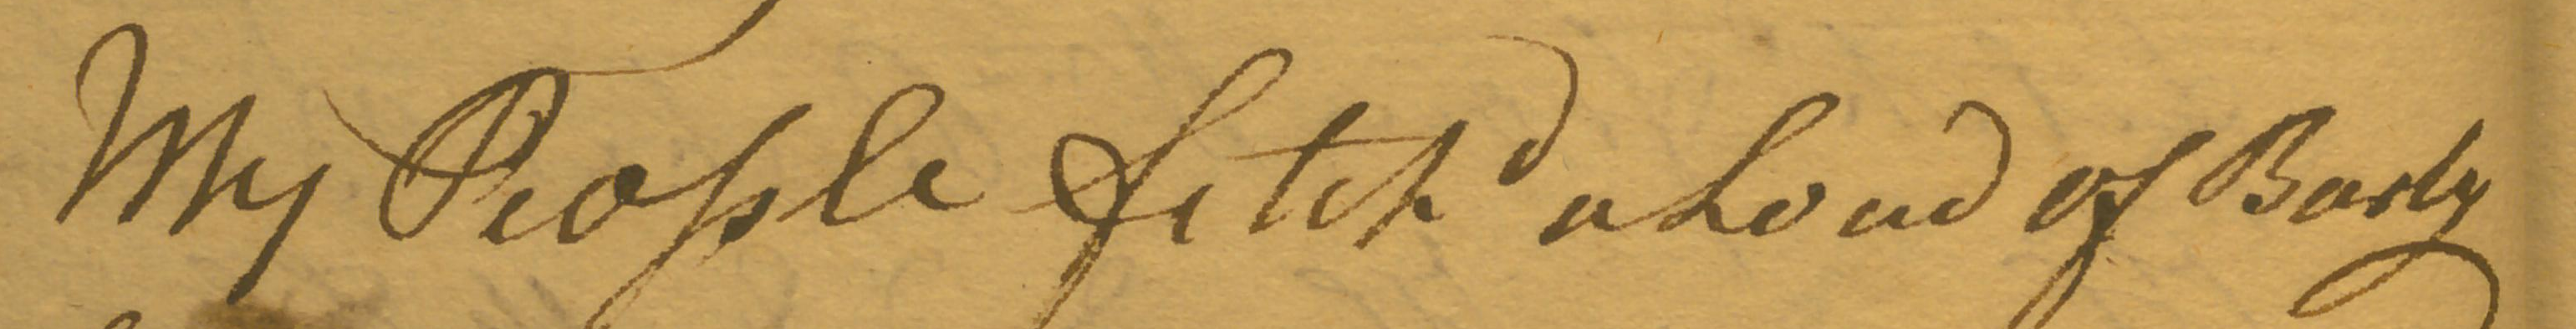My People fetch^d a Loud of Barly
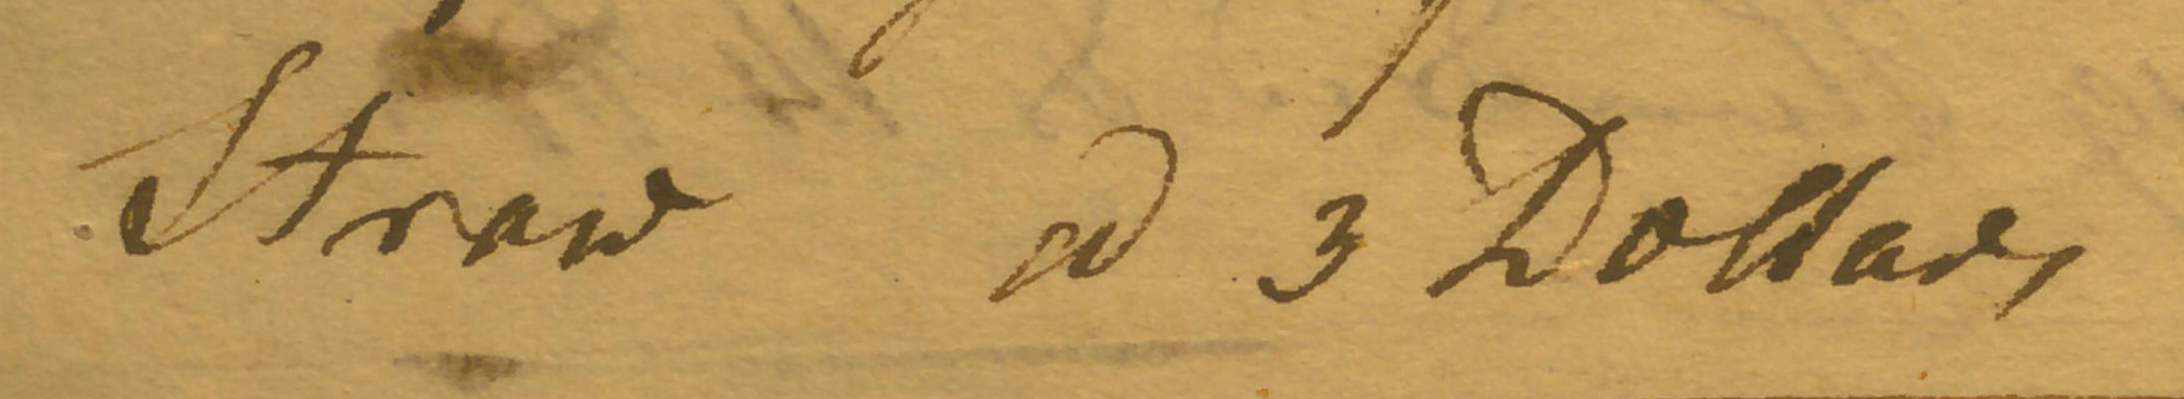Straw @ 3 Dollars
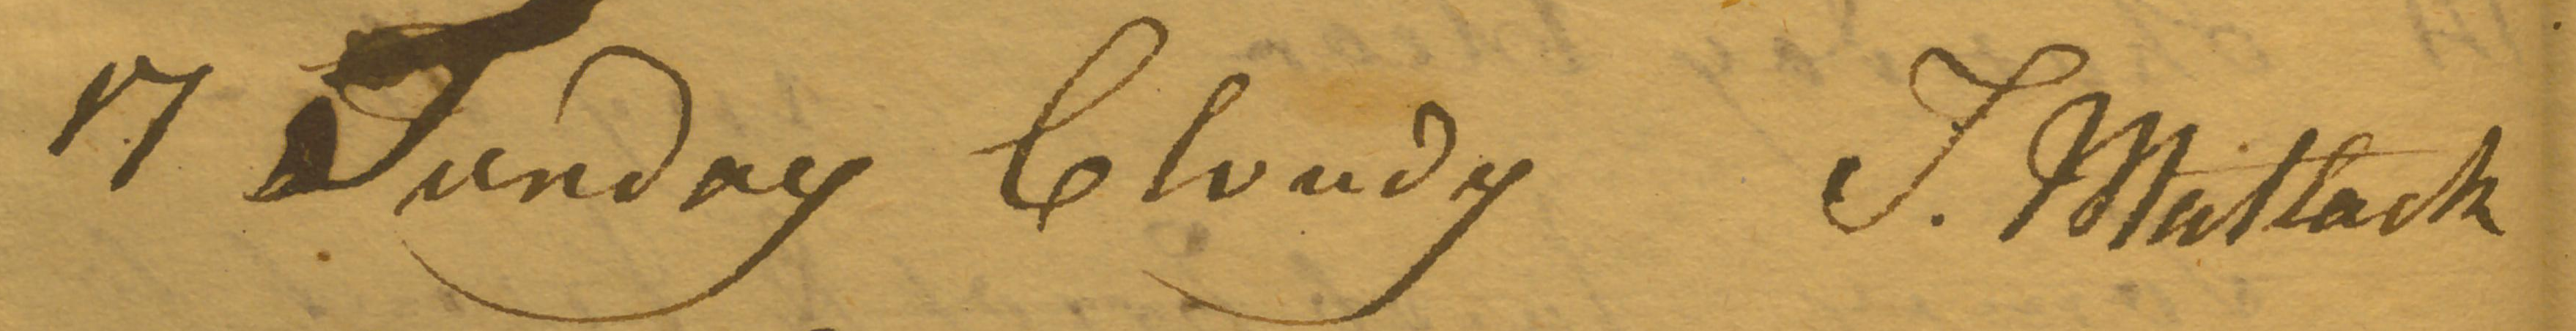17 Sunday Cloudy T. Matlack
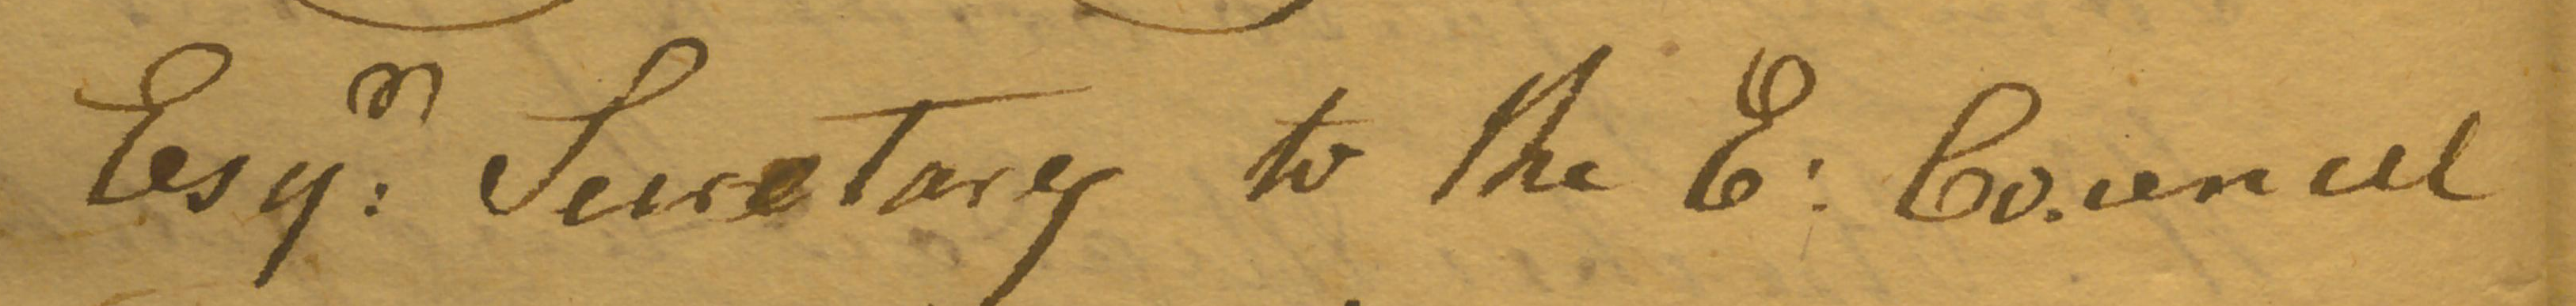Esq^r. Secretary to the E: Councel
